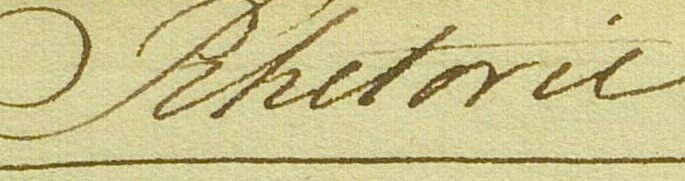Rhetoric
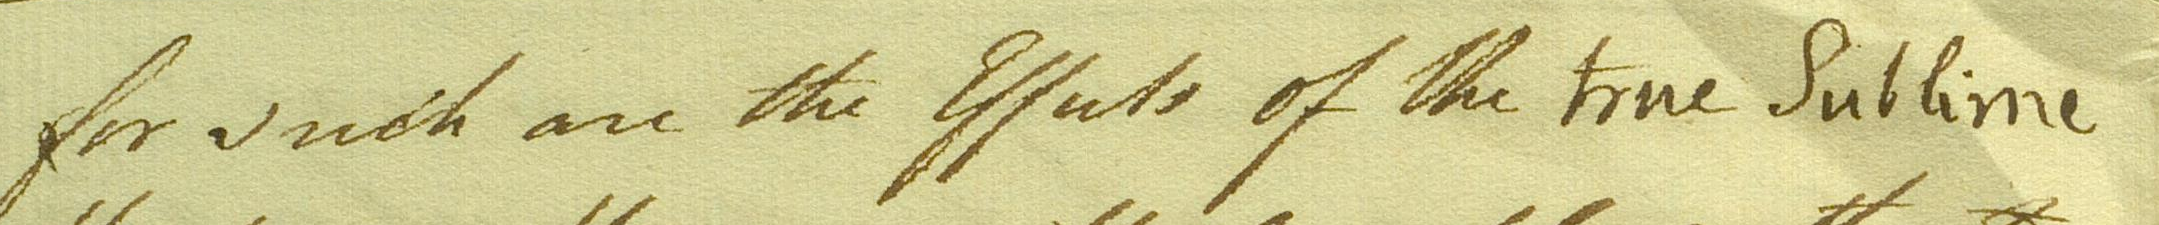for such are the Effects of the true Sublime
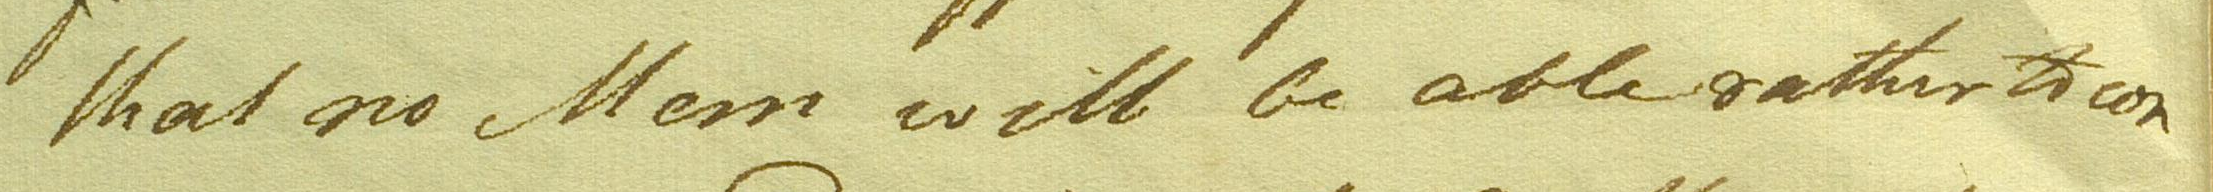that no Man will be able rather to con
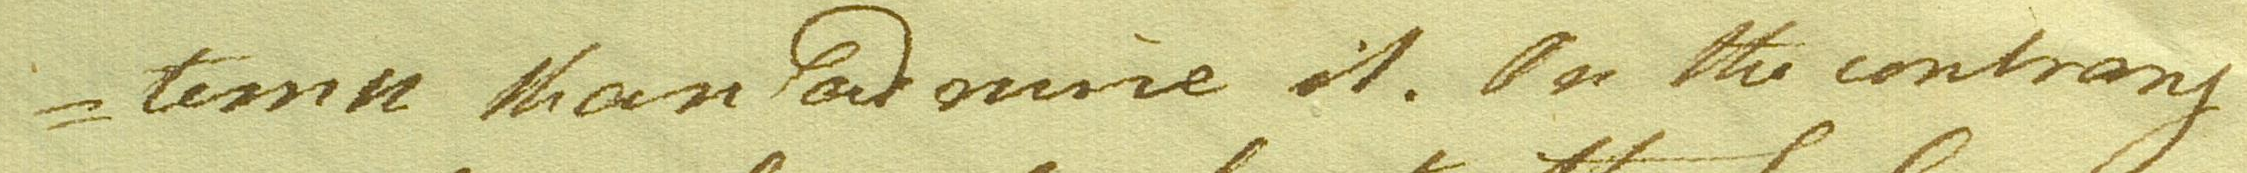-temn than admire it. On the contrary
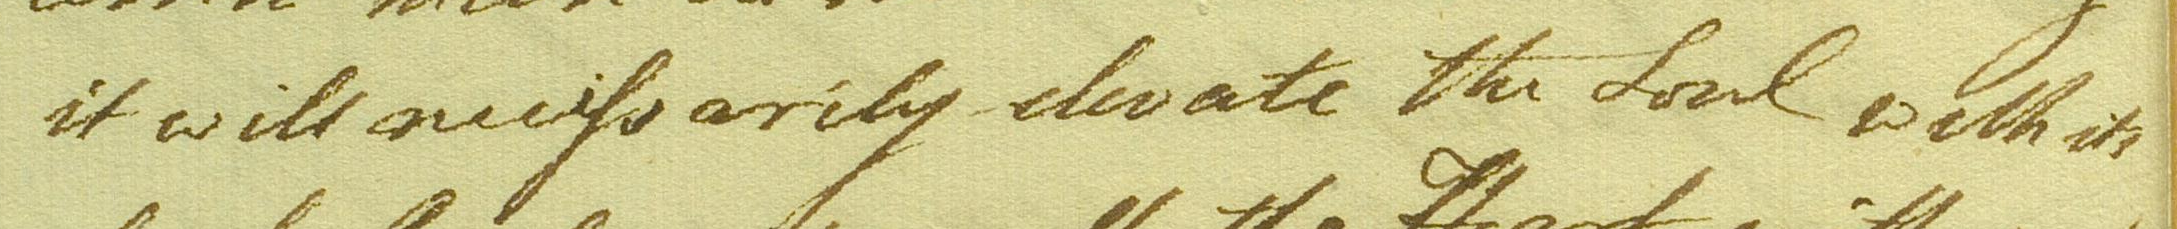it will necessarily elevate the Soul with its
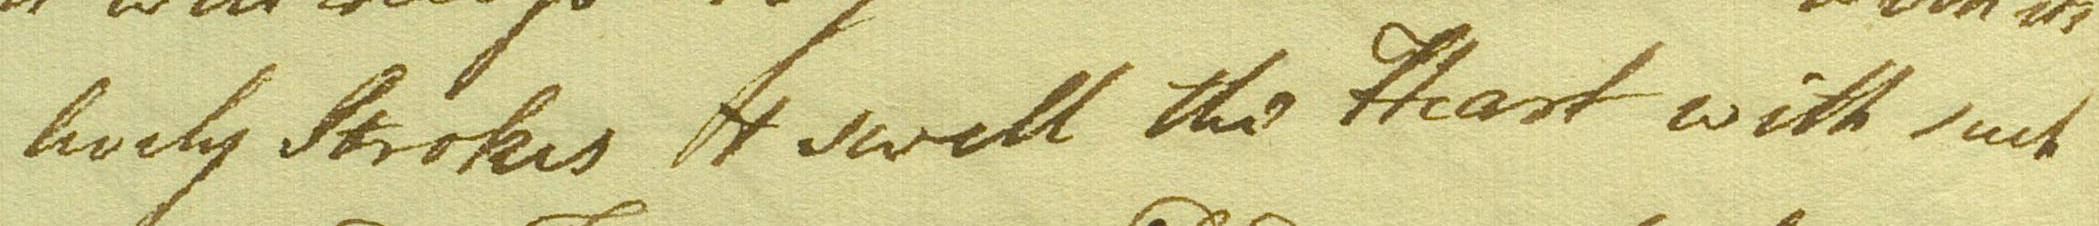lively Strokes & swell the Heart with such
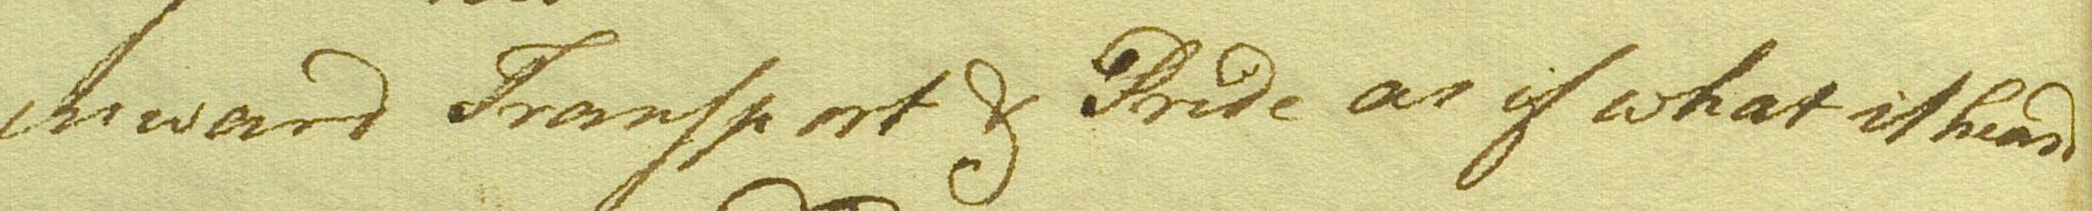inward Transport & Pride as if what it heard
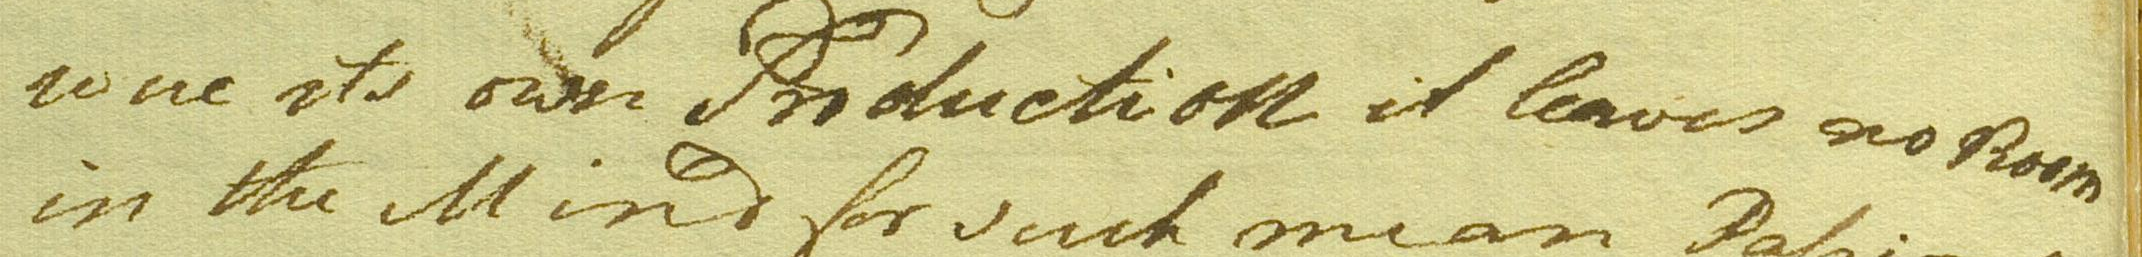were its own Production it leaves no Room
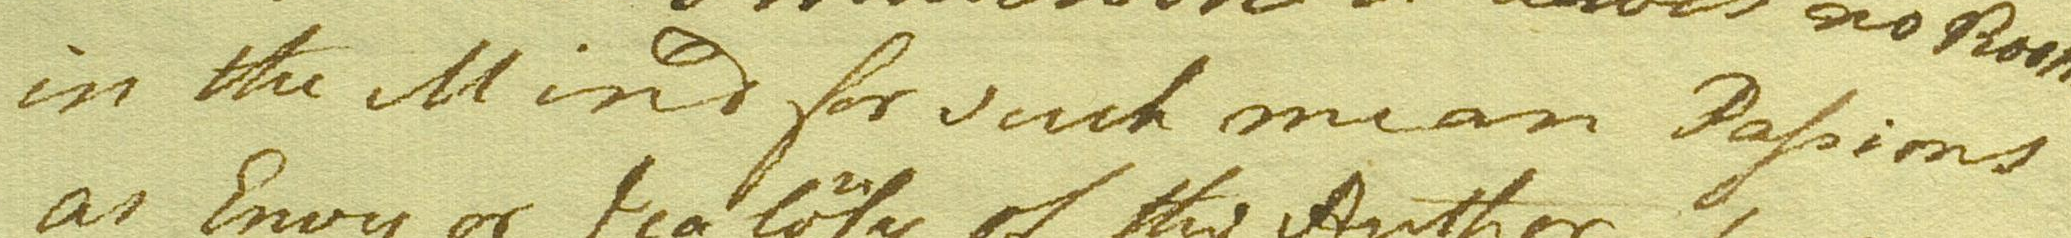in the Mind for such mean Passions
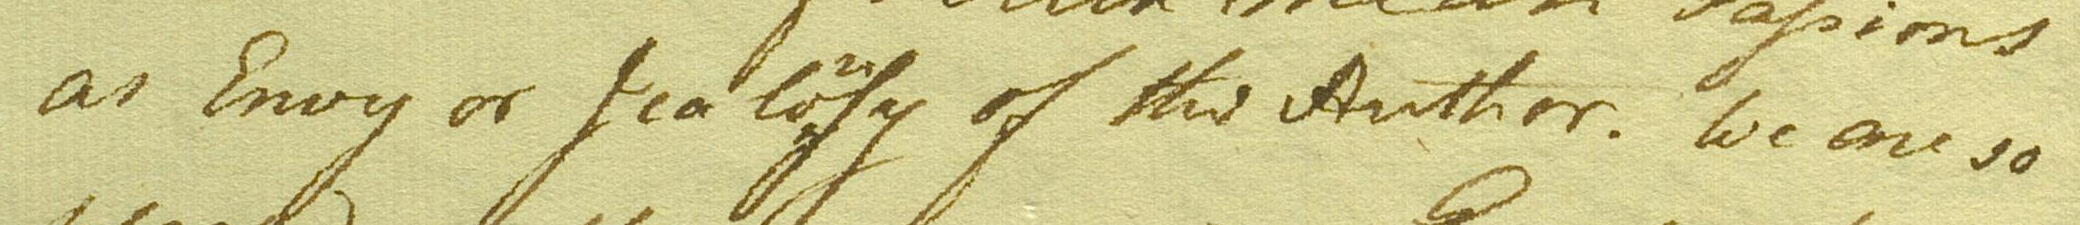as Envy or Jealo^usy of the Author. We are so
